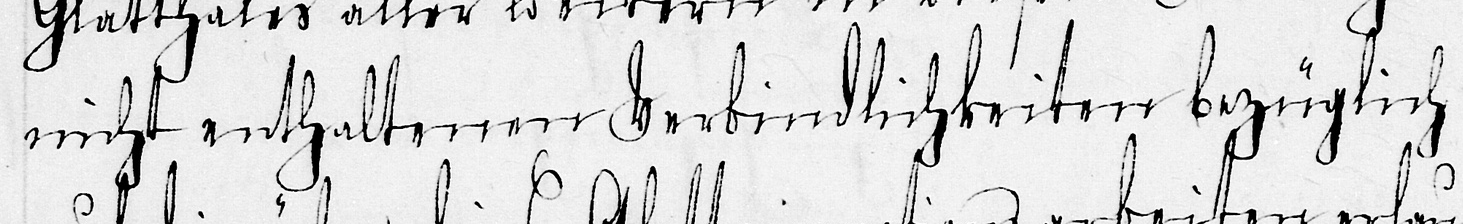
nicht enthaltenen Verbindlichkeiten bezüglich
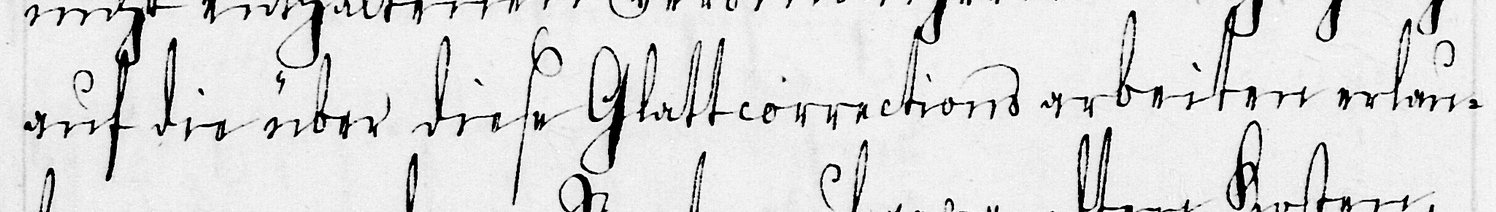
auf die über diese Glattcorrectionsarbeiten verlau¬
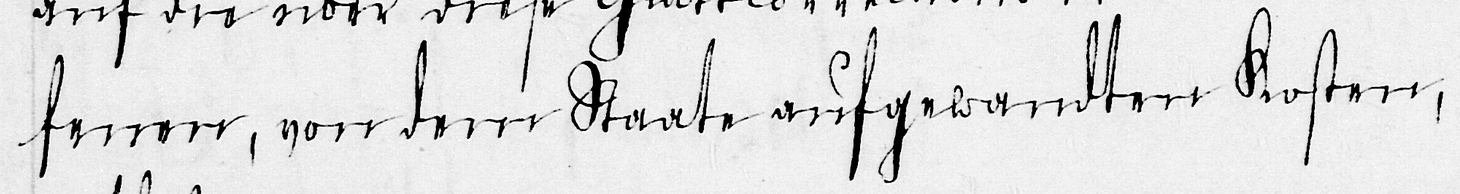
fenen, von dem Staate aufgewandten Kosten,
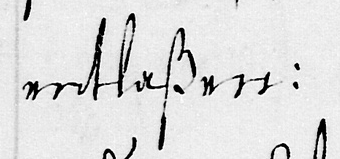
entlaßen:
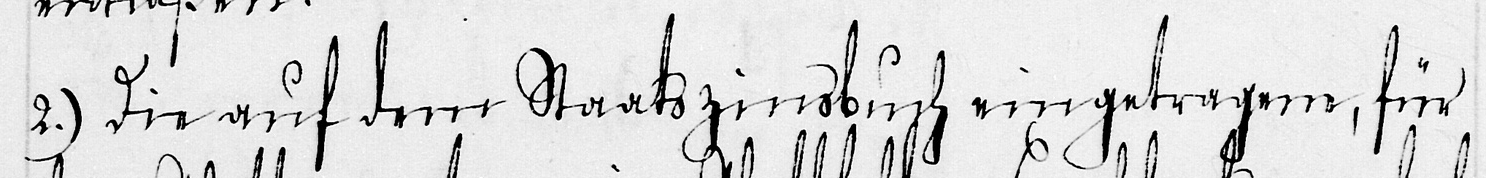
2.) Die auf dem Staatszinsbuch eingetragene, für
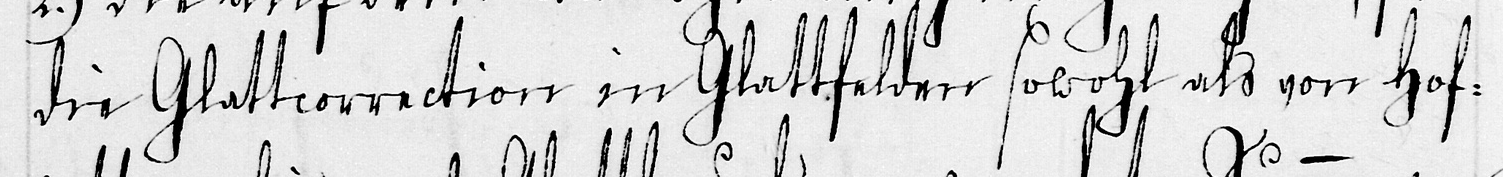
die Glattcorrection in Glattfelden sowohl als von Hof¬
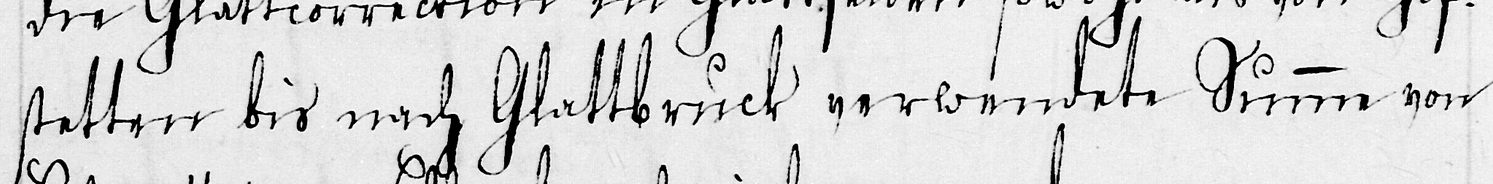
stetten bis nach Glattbruck verwendete Summe von
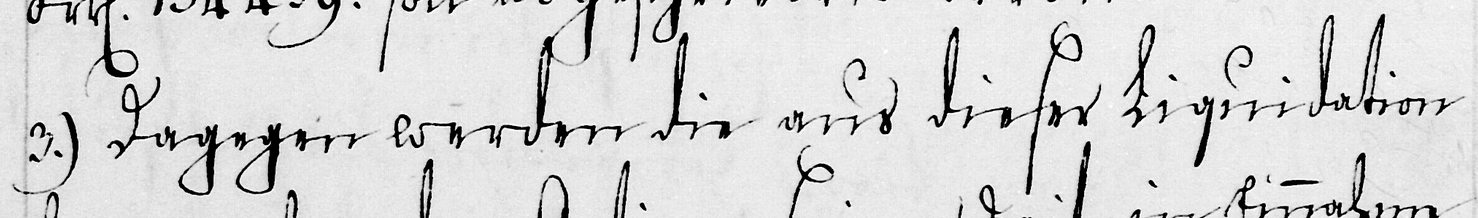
3.) Dagegen werden die aus dieser Liquidation
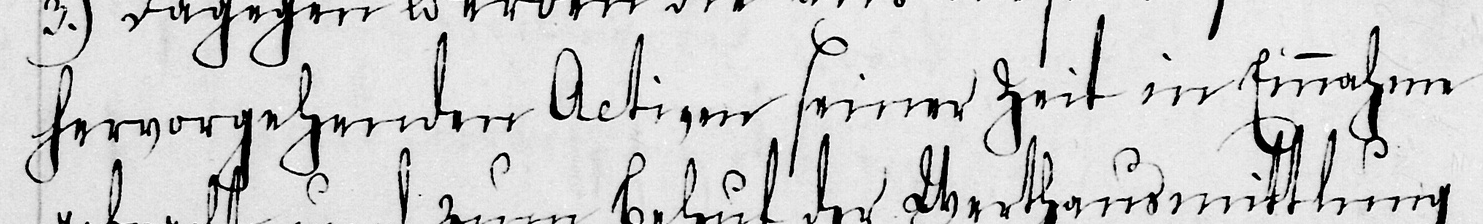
hervorgehenden Activen seiner Zeit in Einnahme
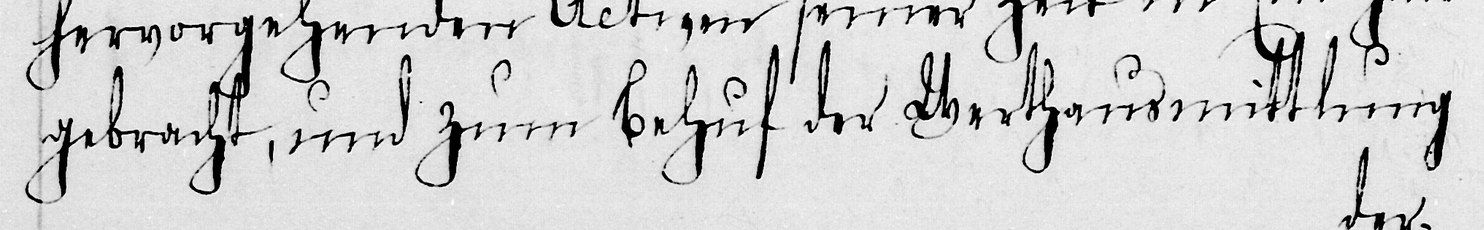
gebracht, und zum Behuf der Werthausmittlung
